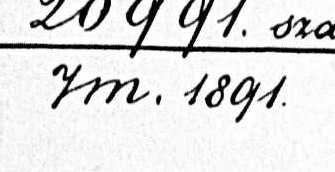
JM 1891
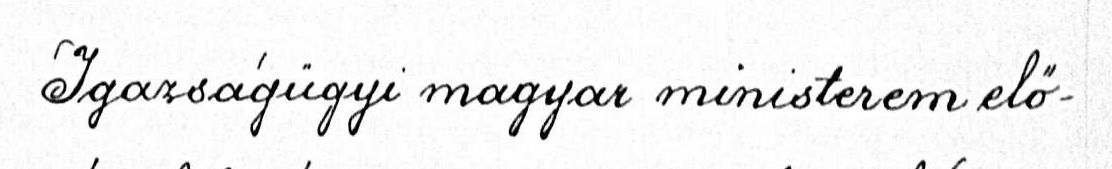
Igazságügyi magyar ministerem elő¬
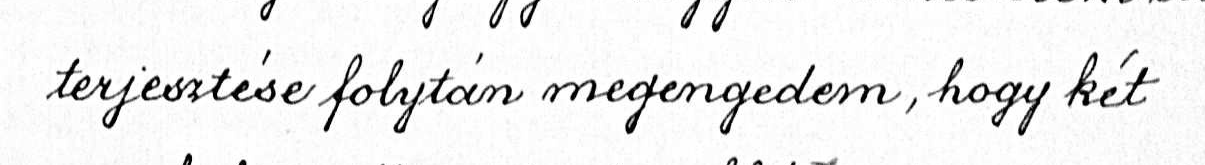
terjesztése folytán megengedem, hogy két
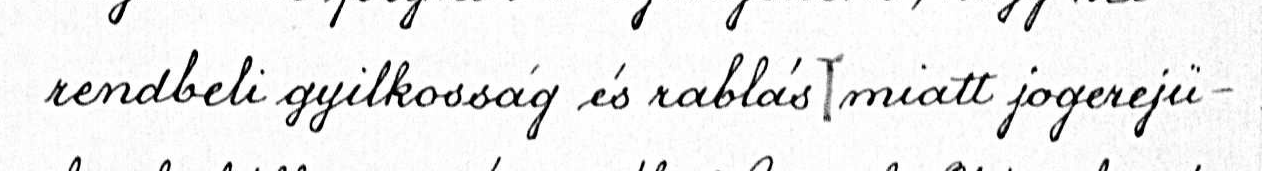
rendbeli gyilkosság és rablás [inserted in pencil:] miatt jogerejü¬
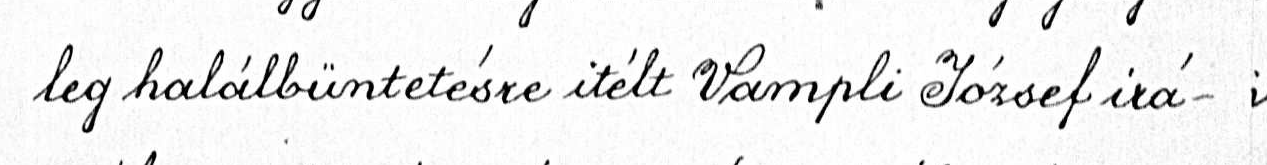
leg halálbüntetésre itélt Vampli József irá¬
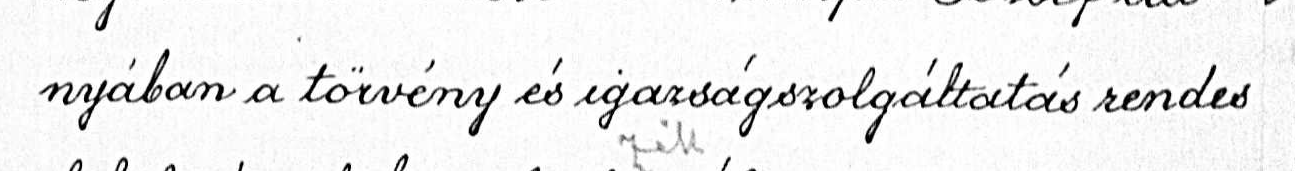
nyában a törvény es igarságszolgáltatás rendes
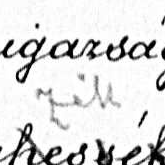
zik
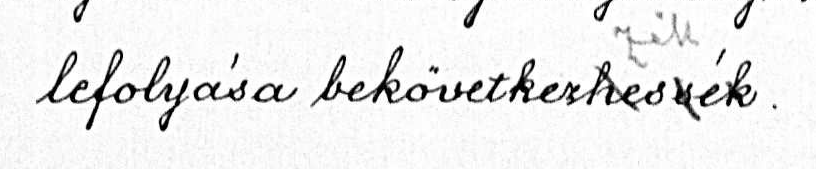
lefolyása bekővetkersék.
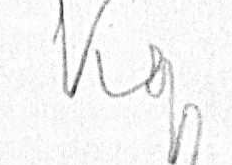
Kg
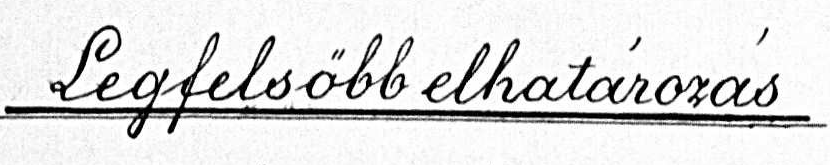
Legfelsőbb elhatározás
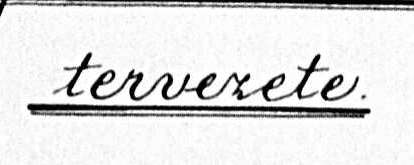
tervezete.
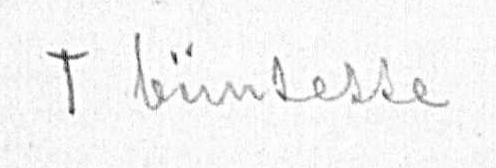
büntette
